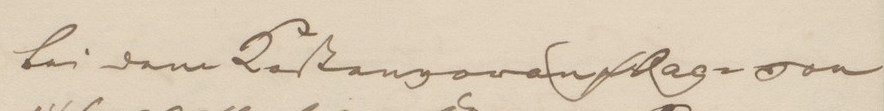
bei dem Kostenvoranschlage von
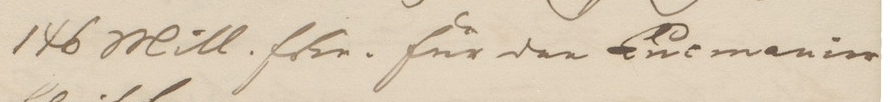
146 Mill. Frkn. für den Lucmanier
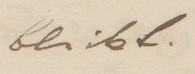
bleibt.
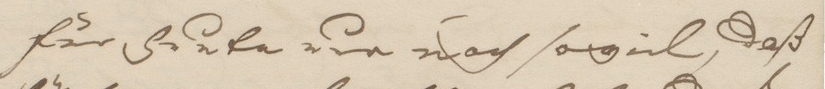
Für heute nur noch soviel, daß
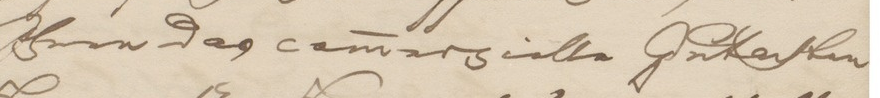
Ihnen das commerzielle Gutachten
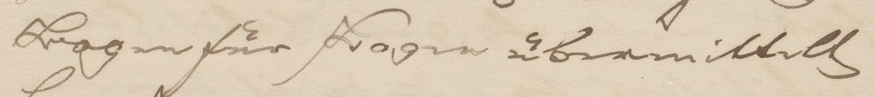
Bogen für Bogen übermittelt
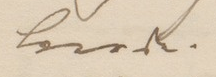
werde.
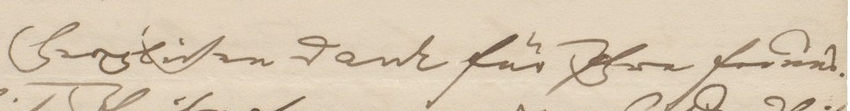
Herzlichen Dank für Ihre freund-
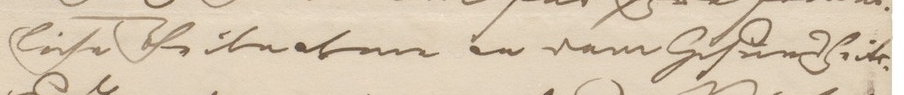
liche Theilnahme an dem Gesundheits-
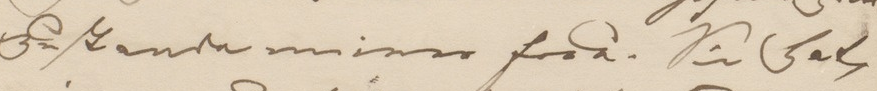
zustande meiner Frau. Sie hat,
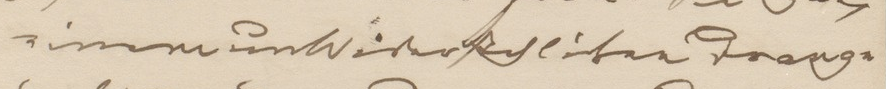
einem unwiderstehlichen Drange
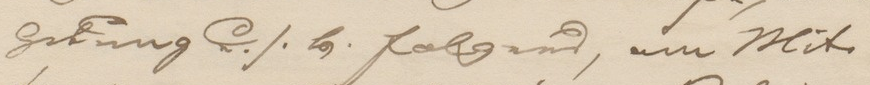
gebung u. s. w. folgend, am Mit-
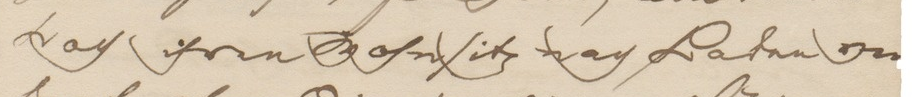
woch ihren Wohnsitz nach Baden ver-
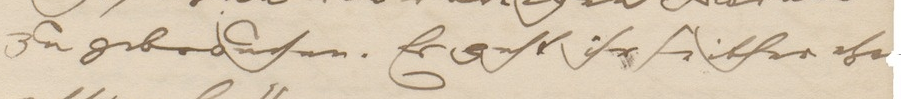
zu gebrauchen. Es geht ihr seither eher
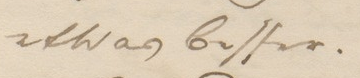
etwas besser.
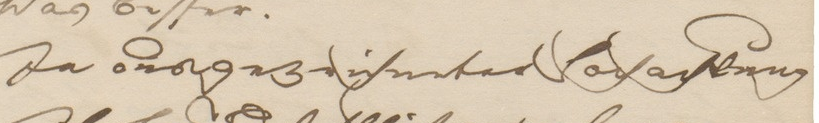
In ausgezeichneter Hochachtung
